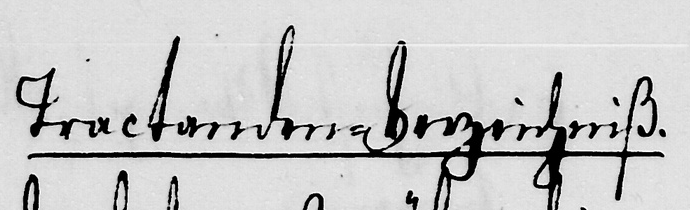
Tractanden-Verzeichniß.
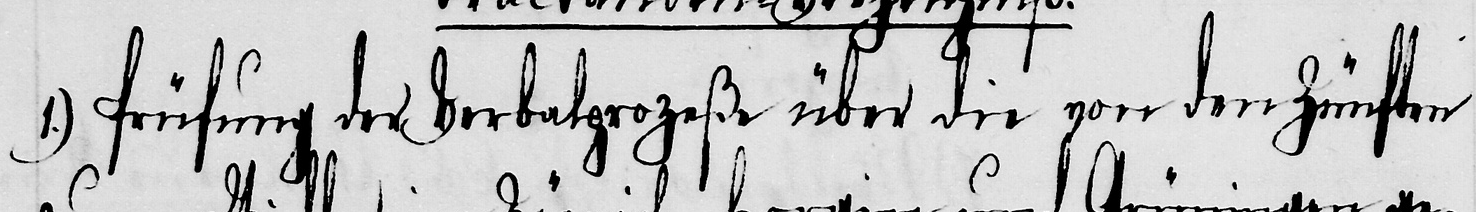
1.) Prüfung der Verbalprozeße über die von den Zünften
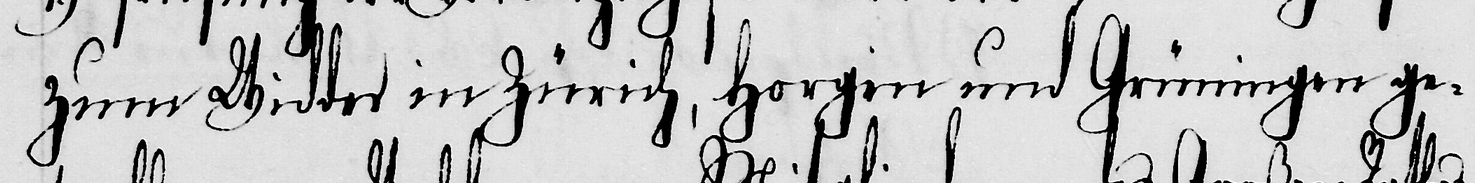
zum Widder in Zürich, Horgen und Grüningen ge¬
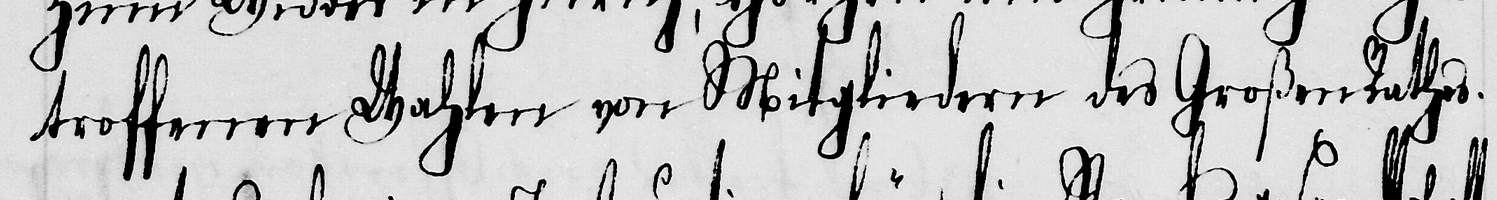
troffenen Wahlen von Mitgliedern des Großen Rathes.
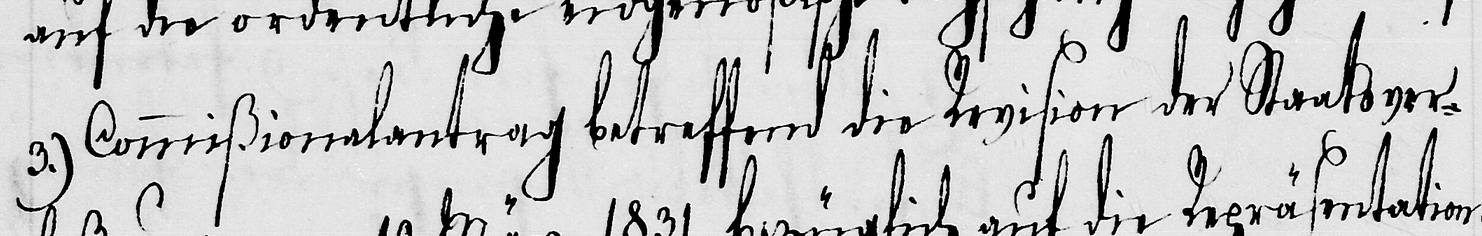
3.) Commißionalantrag betreffend die Revision der Staatsver¬
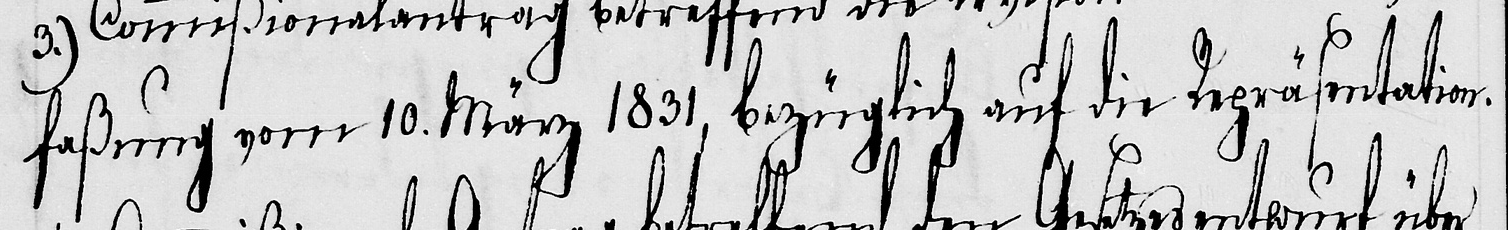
faßung vom 10. März 1831, bezüglich auf die Repräsentatio¬
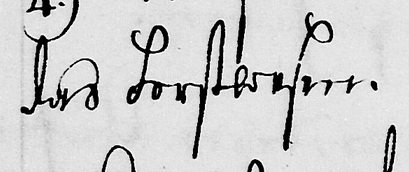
das Forstwesen.
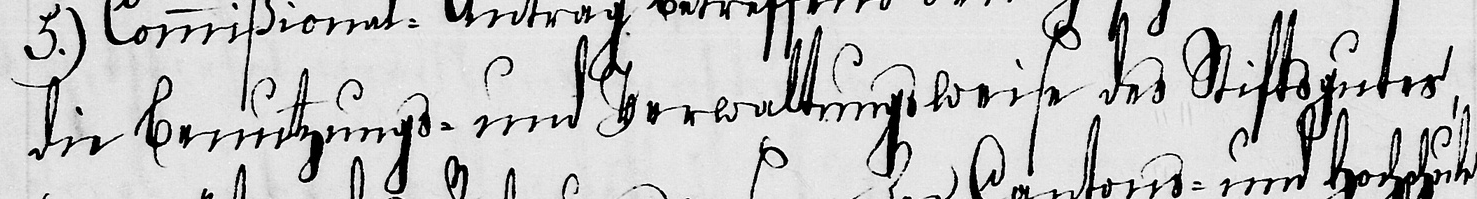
die Benutzungs- und Verwaltungsweise des Stiftsgutes
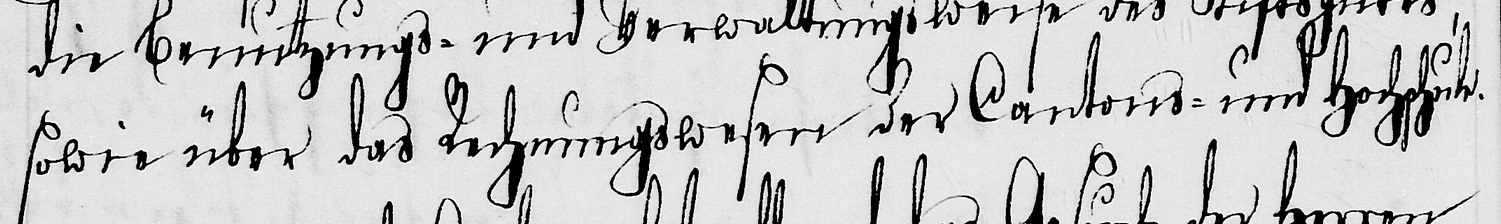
sowie über das Rechnungswesen der Cantons- und Hochsch¬
